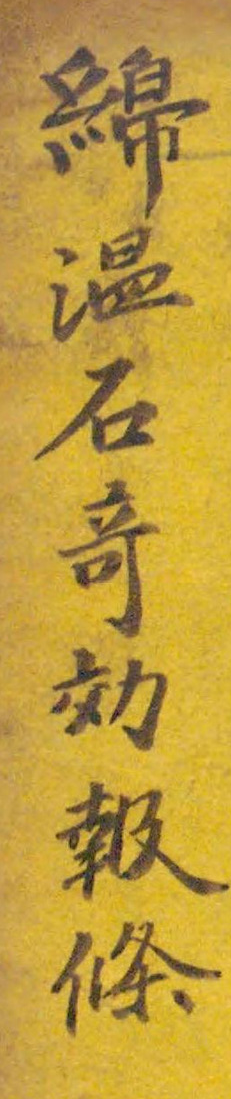綿温石奇効報條

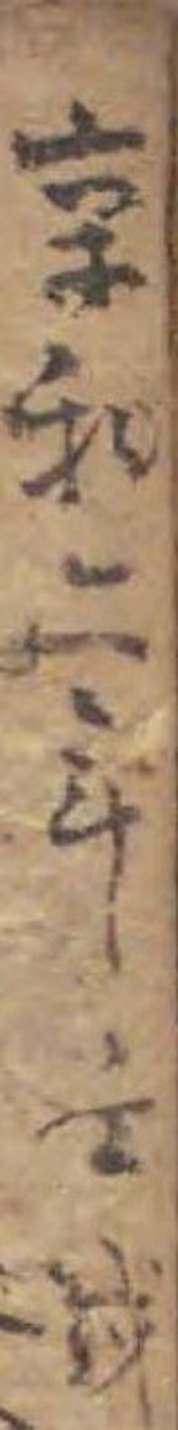享和二年壬戌
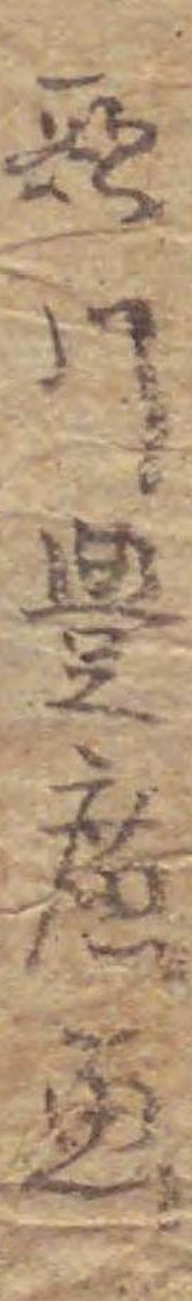歌川豊廣画

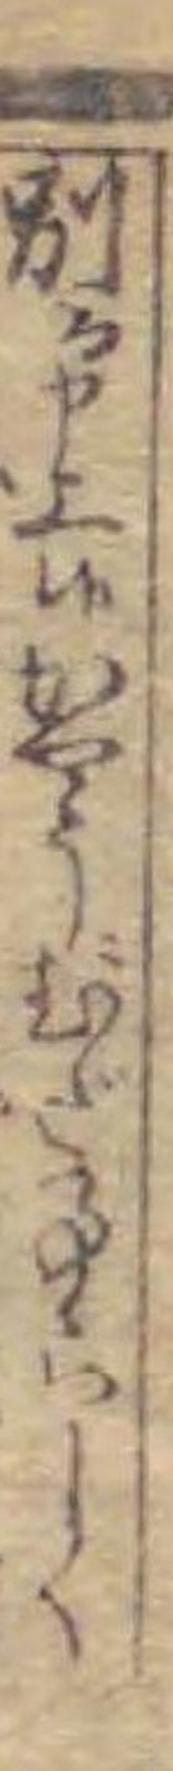別而申上候かやうにむだ事らしく
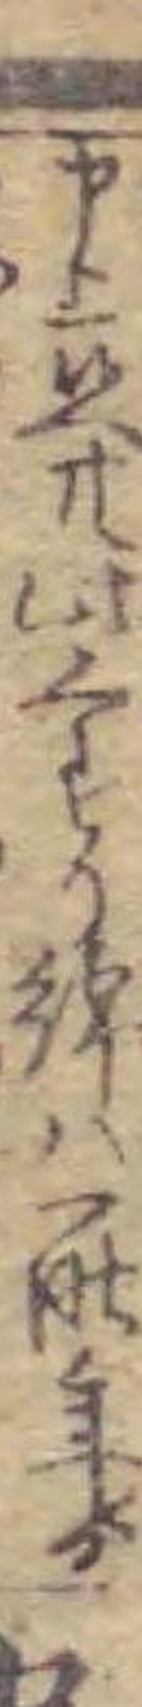申上候へ共此くすり綿は一昨年より
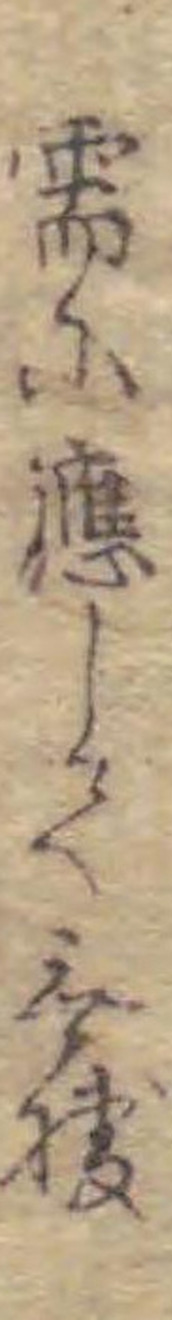需に応して無拠
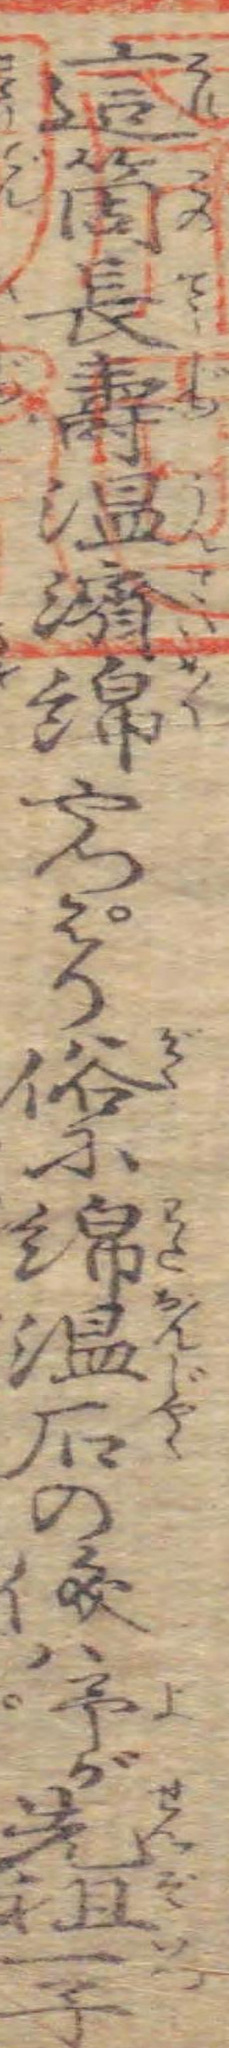這箇長寿温済綿やつぱり俗に綿温石の儀は予が先祖一子
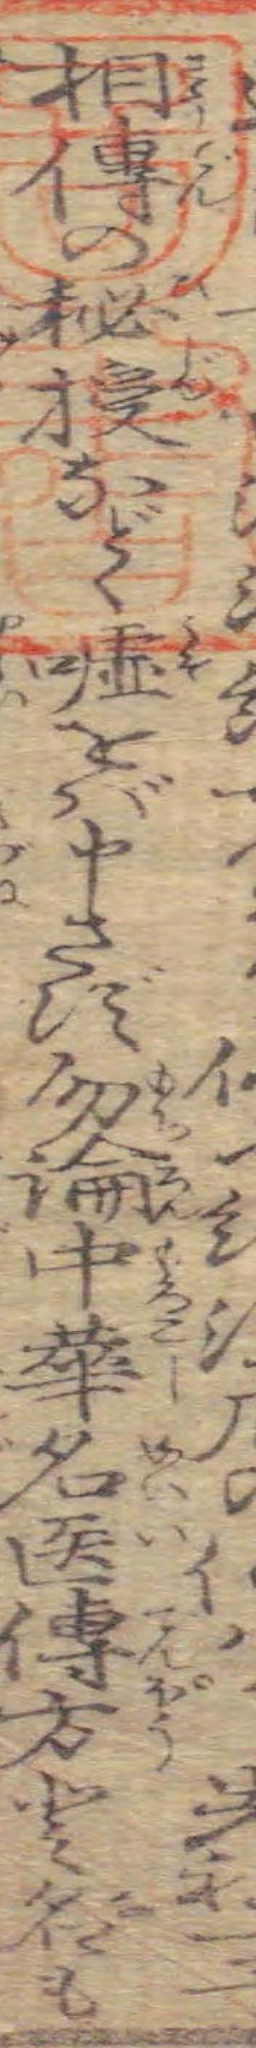相伝の秘授などゝ嘘をば申さず勿論中華名医伝方と名も
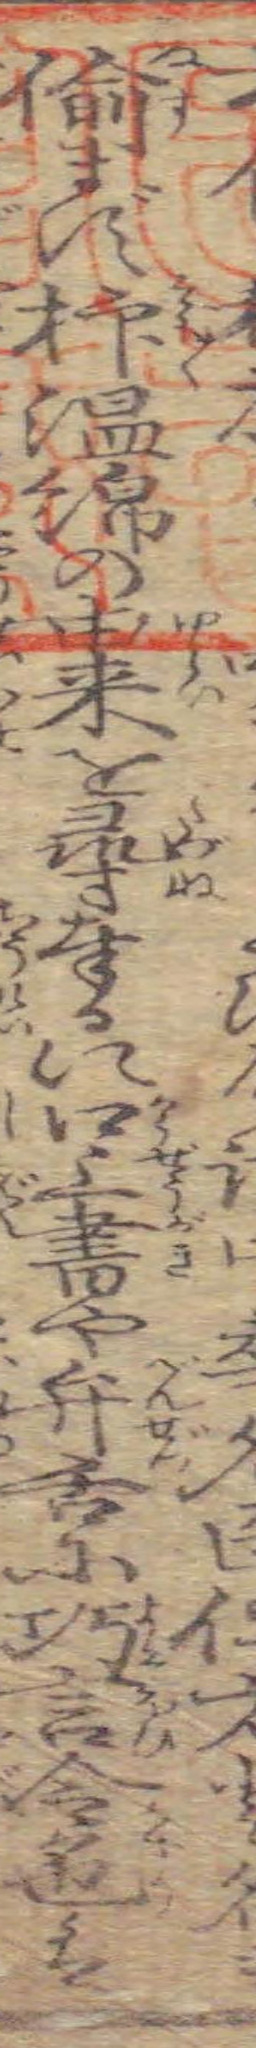偸まず抑温綿の由来を尋奉るに口上書や弁舌に巧言令色は
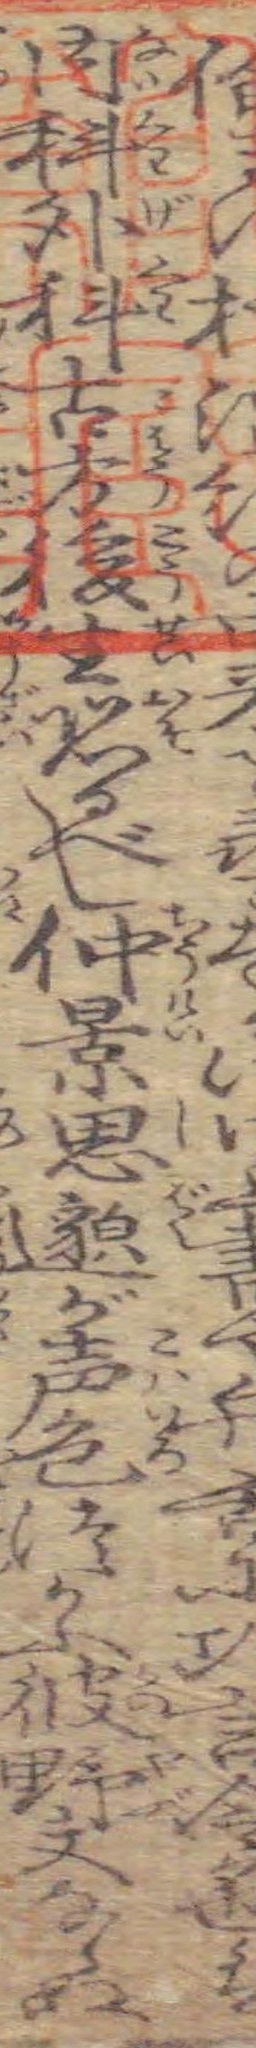内科外科古方後生恐るべし仲景思邈が声色つかふ彼野夫ならぬ
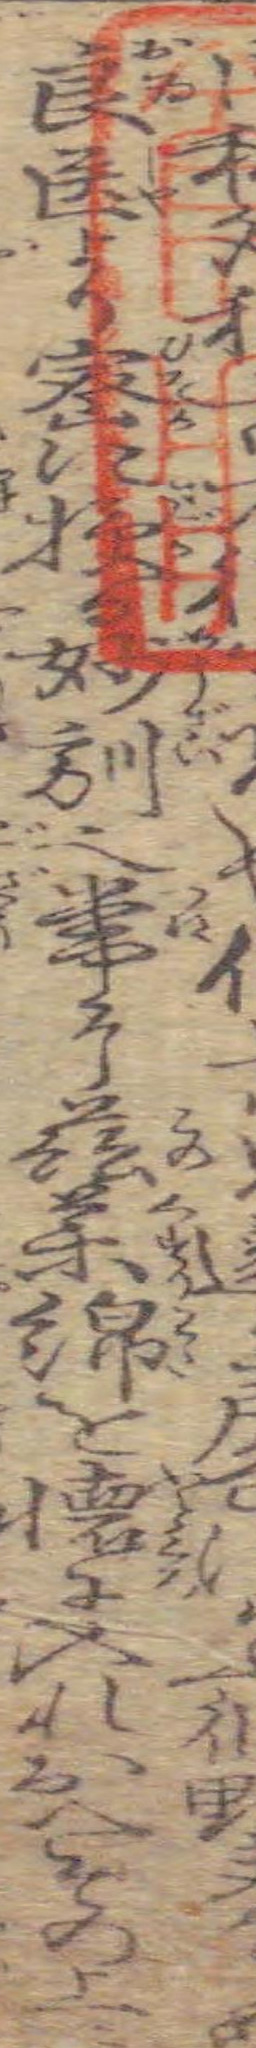良医より密に授る妙剤也常に茲薬綿を懐に入れおへその上に
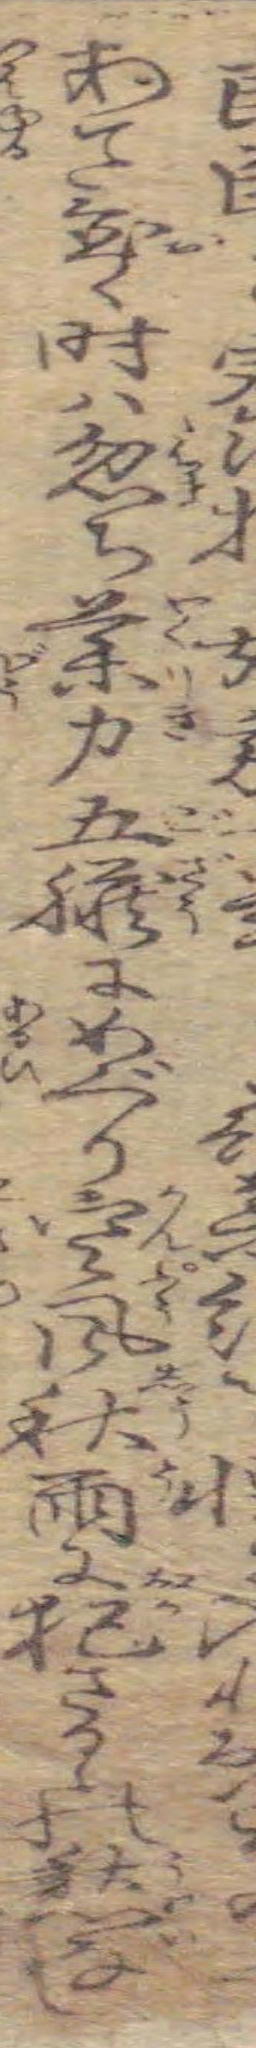あて置く時は忽ち薬力五臓にめぐり寒風秋雨に犯さるゝの愁なし
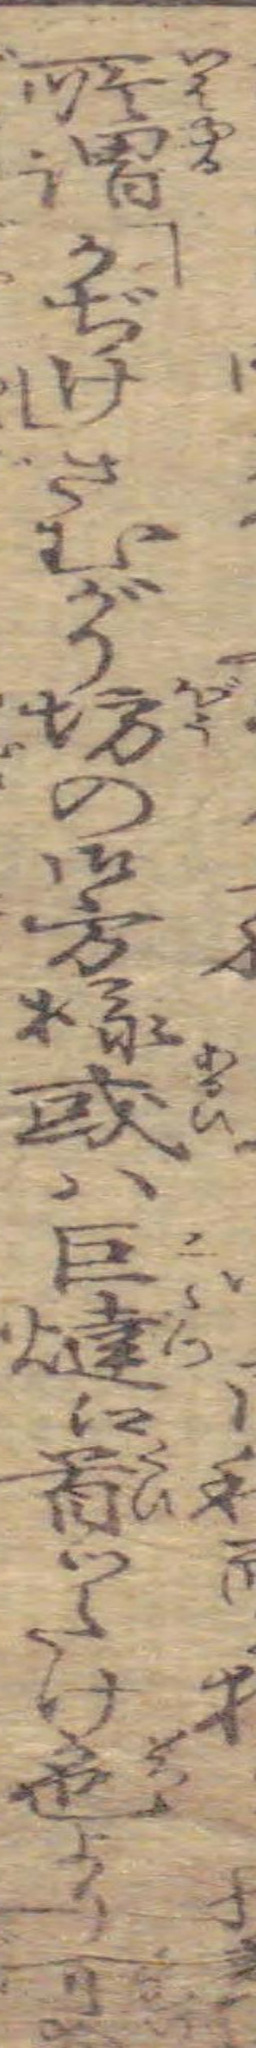所謂「かぢけ」さむがり坊の御方様或は巨燵え首つたけ色より介
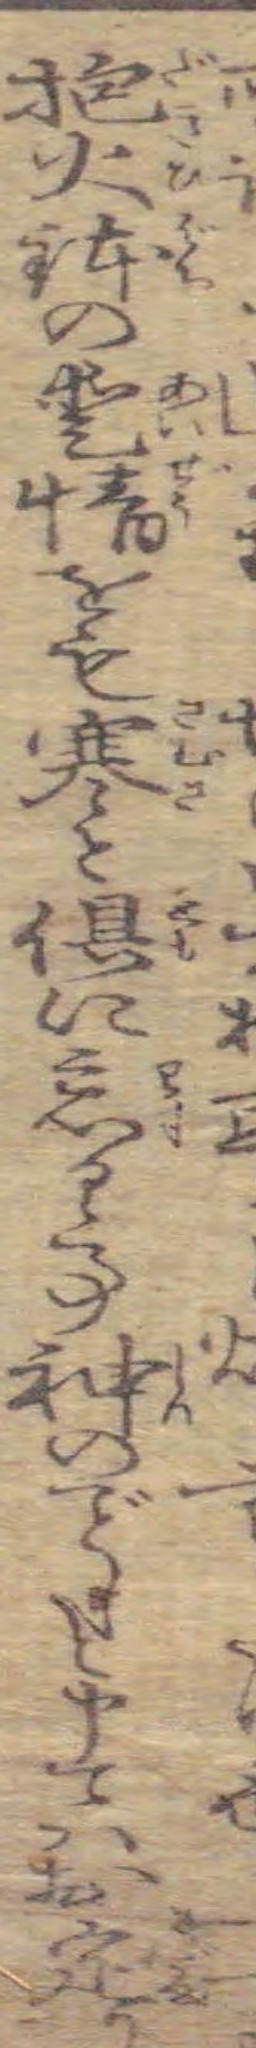抱火鉢の愛情をも寒と倶に忘るゝ事神のごとしと申てはお定りの
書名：綿温石奇効報条 : 3巻
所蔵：国立国会図書館 National Diet Library, JAPAN
